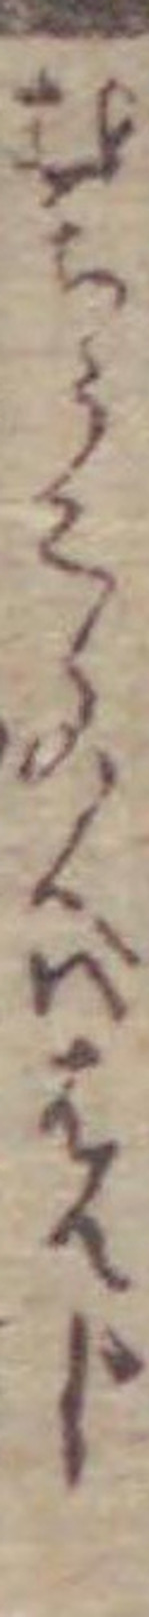むちうこくの人ははんじ
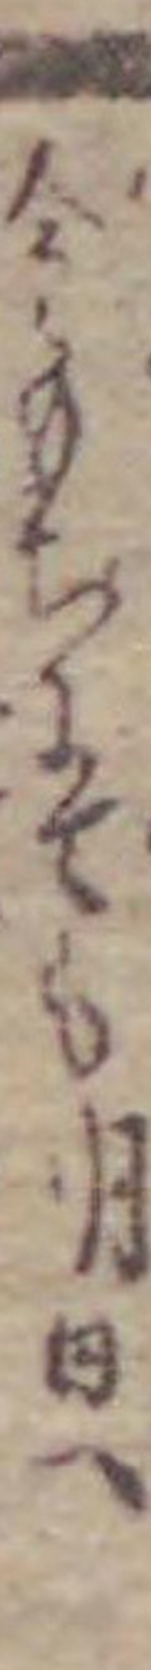金もちにても明日は
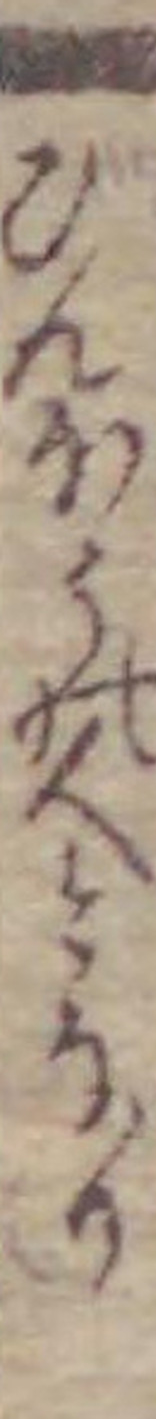びんほうの人となり
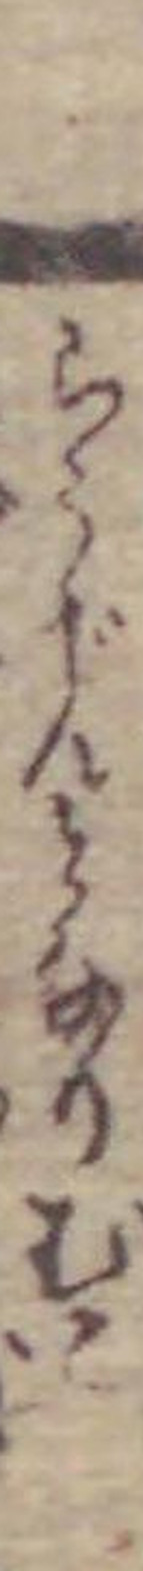らうじんとなりむこ
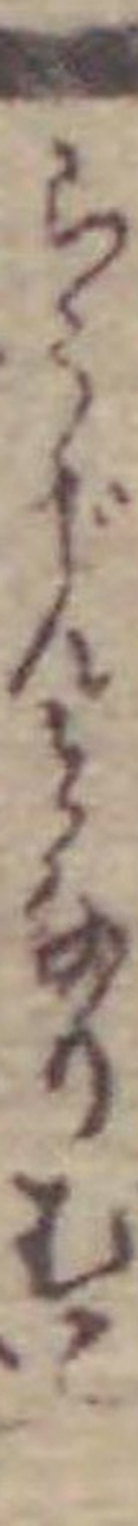らうじんとなりむこ
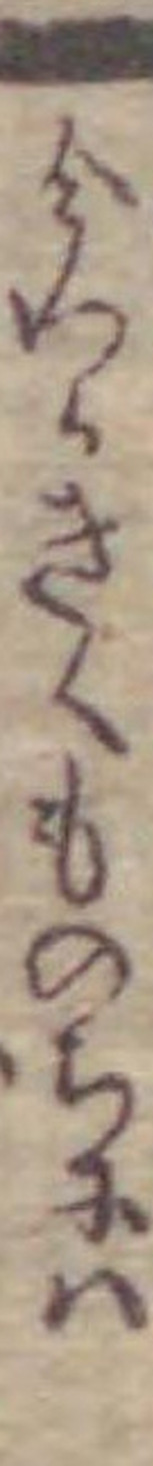今わかき人ものちには
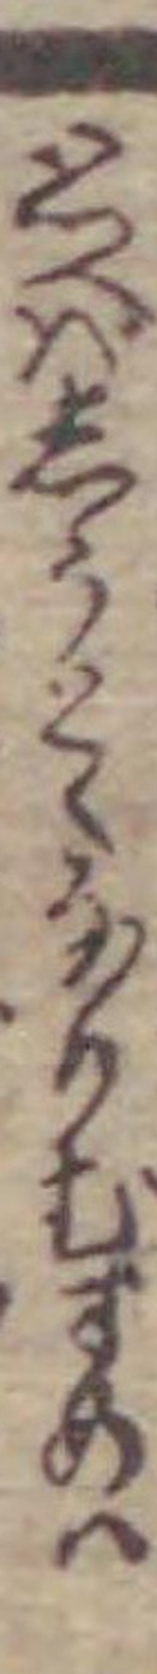思へばしうとゝなりむすめは
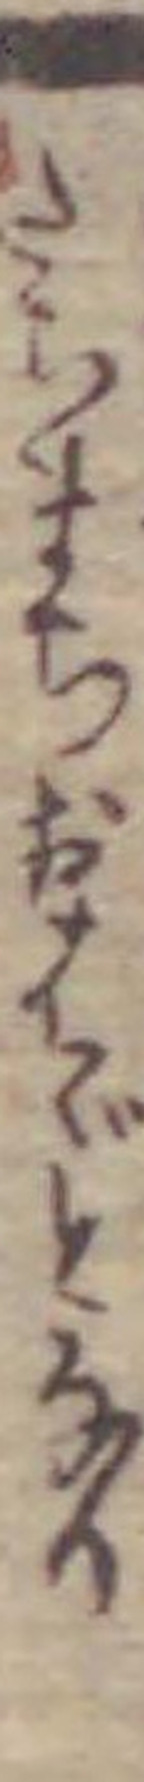たちまちおはゞとなり
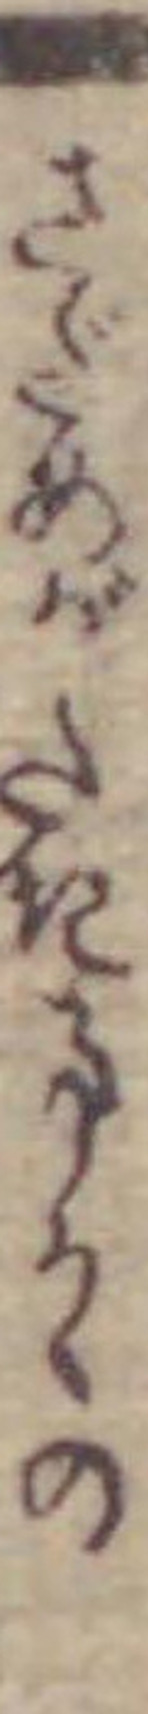さだめがたき事かくの
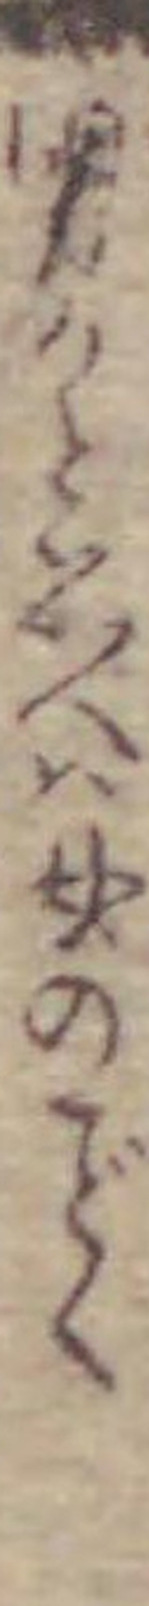男かと思へは女のごとく
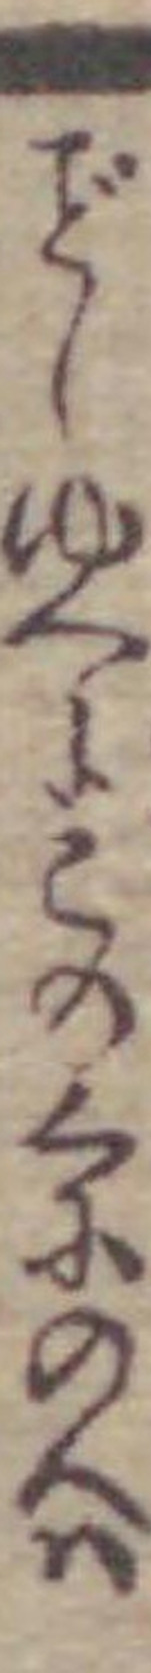ごとしゆへにこのくにの人は
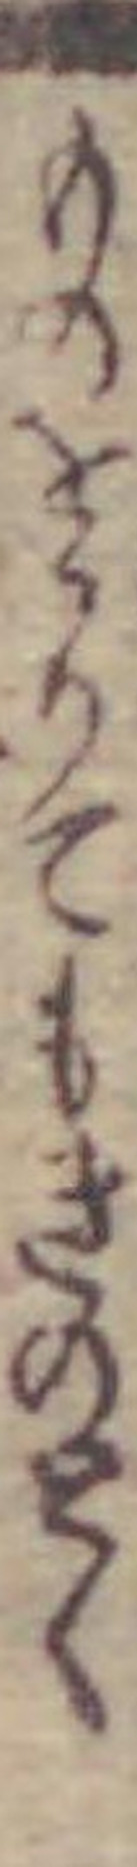ものをかりてもきのとく
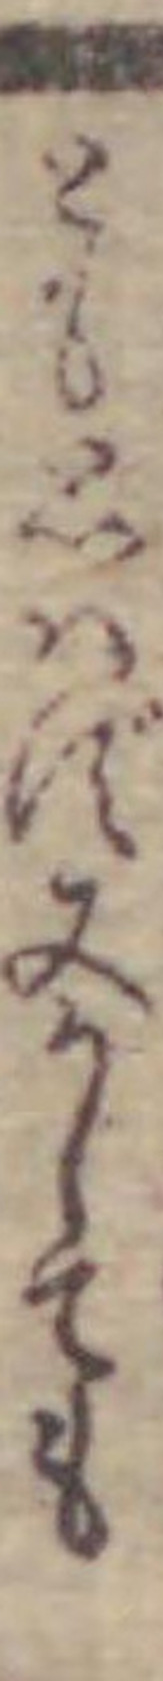とも思はず又かしても
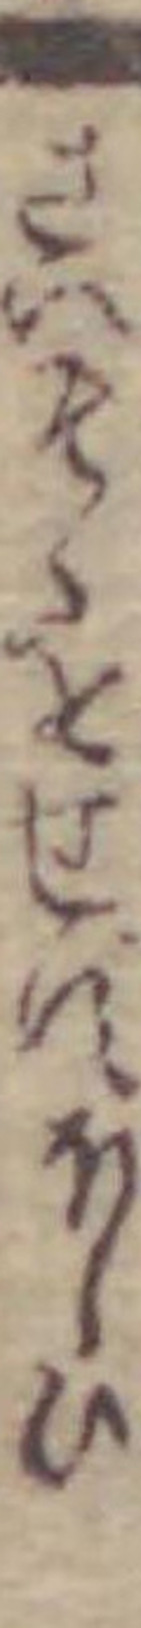さいそくをせずほしひ
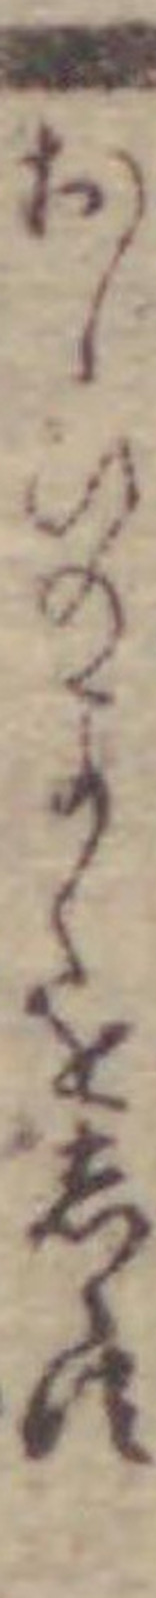おしひのよくをしらす
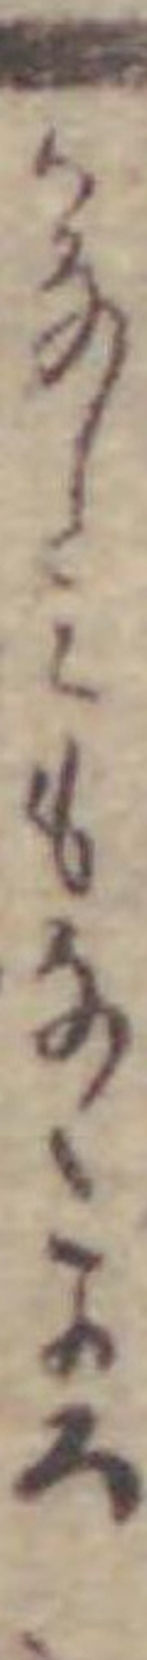かなしみもなくよろ
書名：和荘兵衛後日話 : 3巻
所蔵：国立国会図書館 National Diet Library, JAPAN
